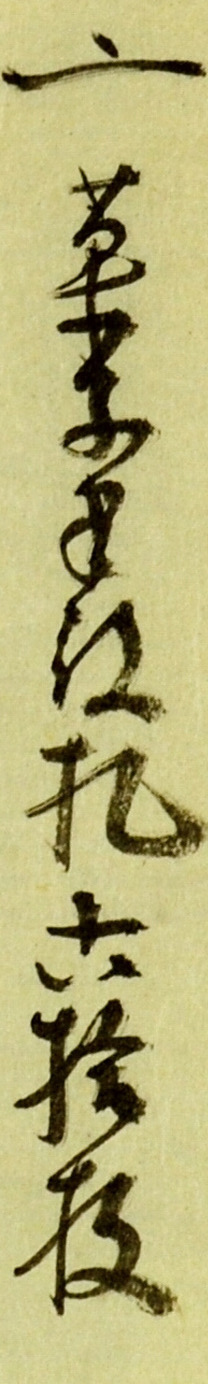〆菓子半役札六拾枚
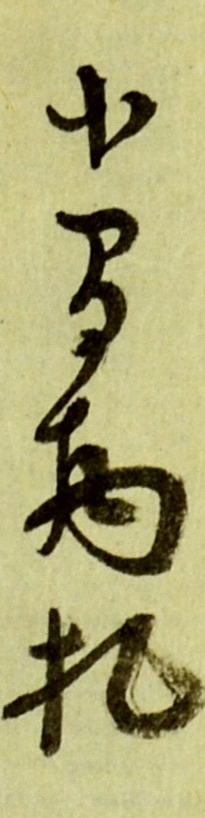小間物札

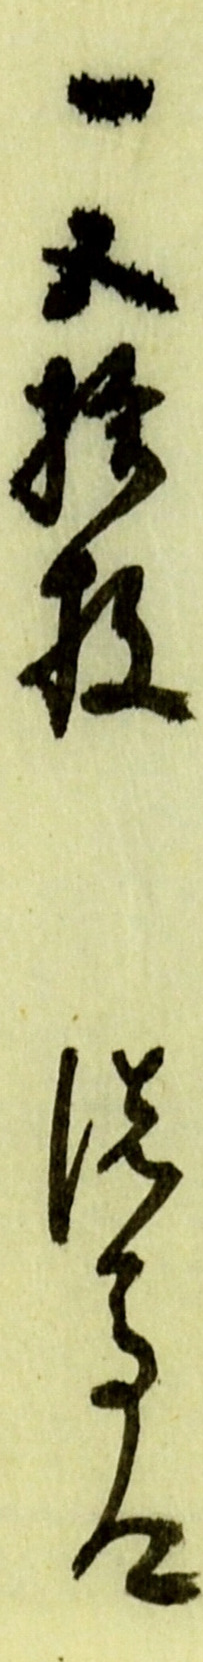一五拾枚洗馬郷
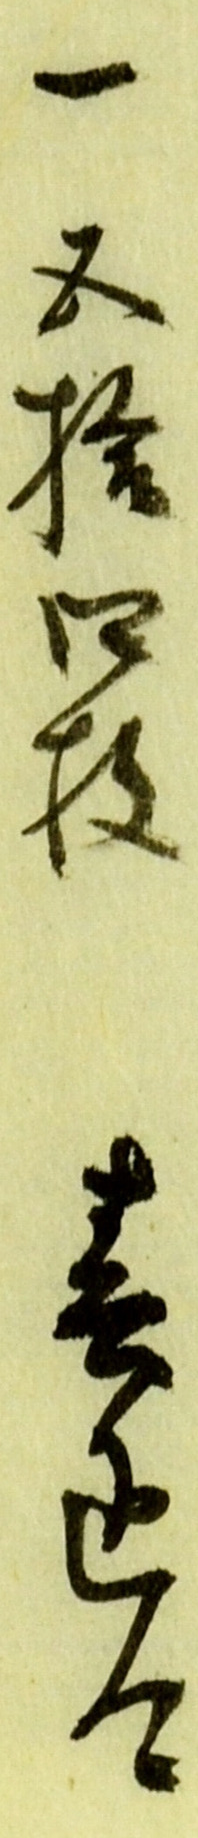一五拾四枚春近郷
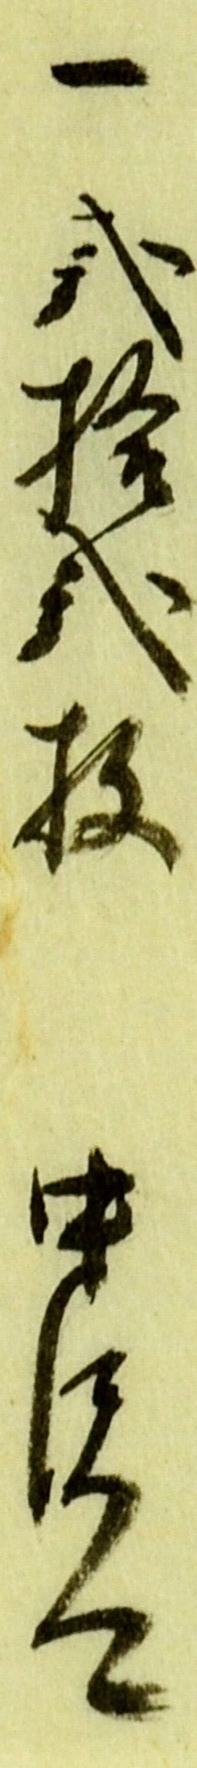一弐拾弐枚中沢郷
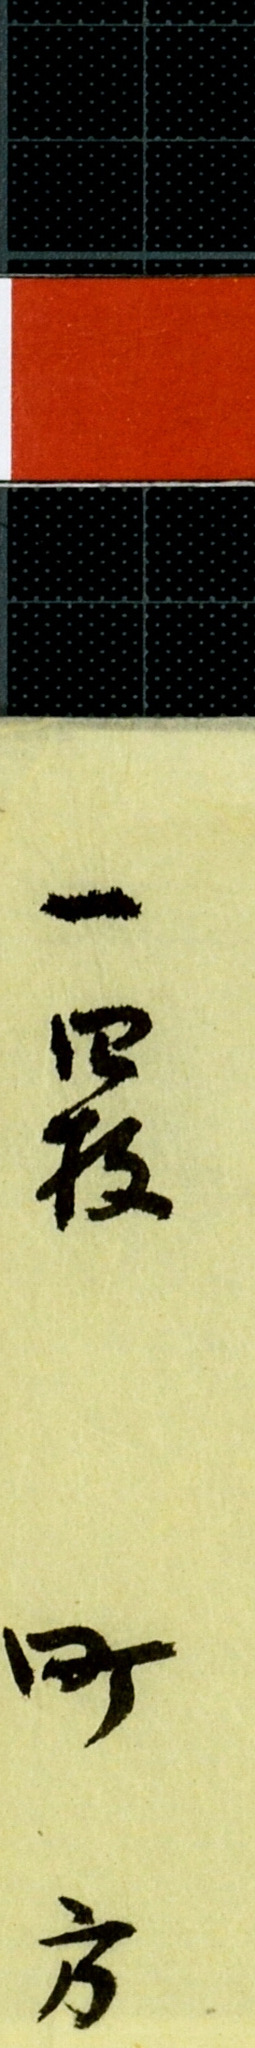一四枚町方
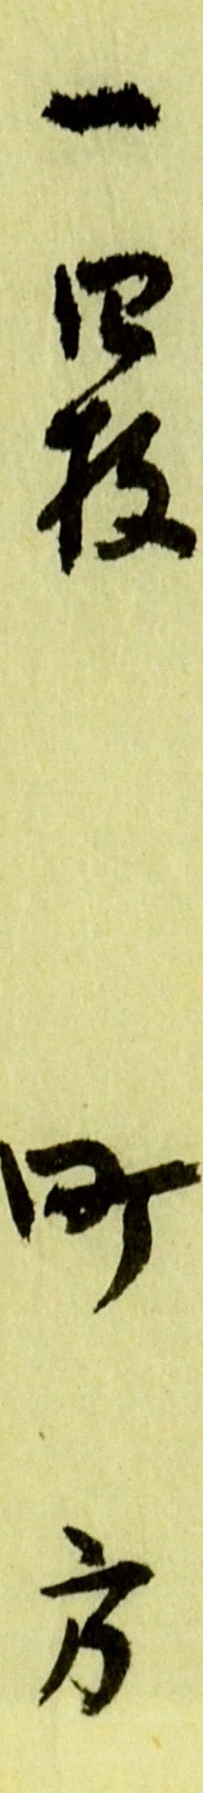一四枚町方
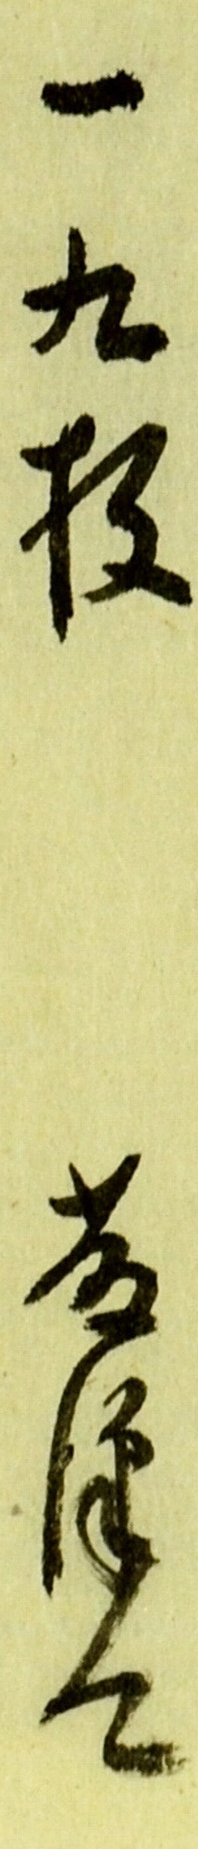一九枚藤沢郷
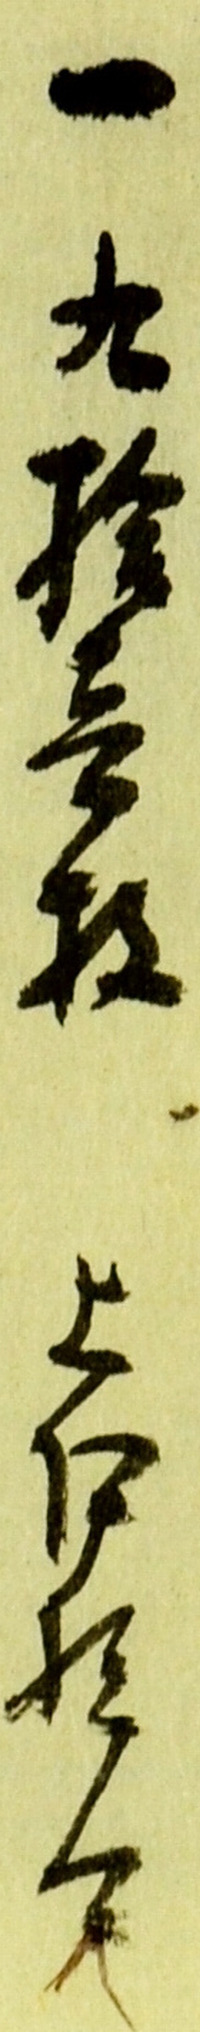一九拾壱枚上伊那郷
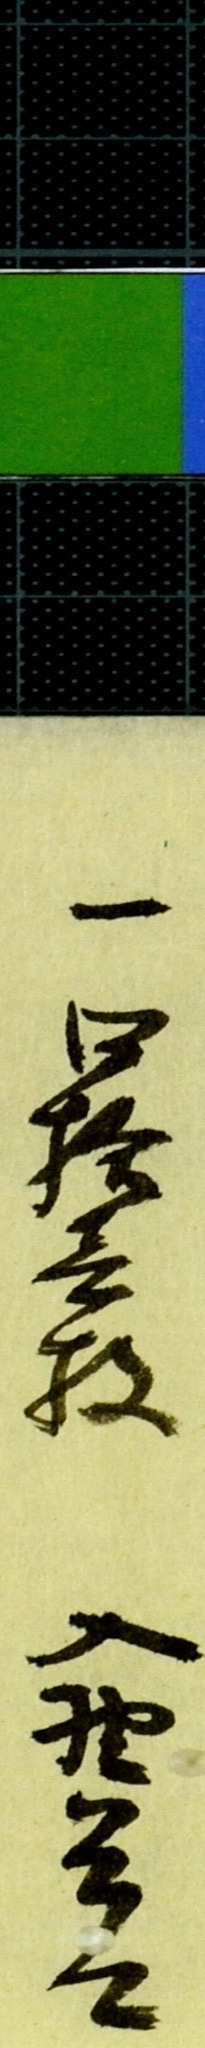一四拾壱枚入野谷郷
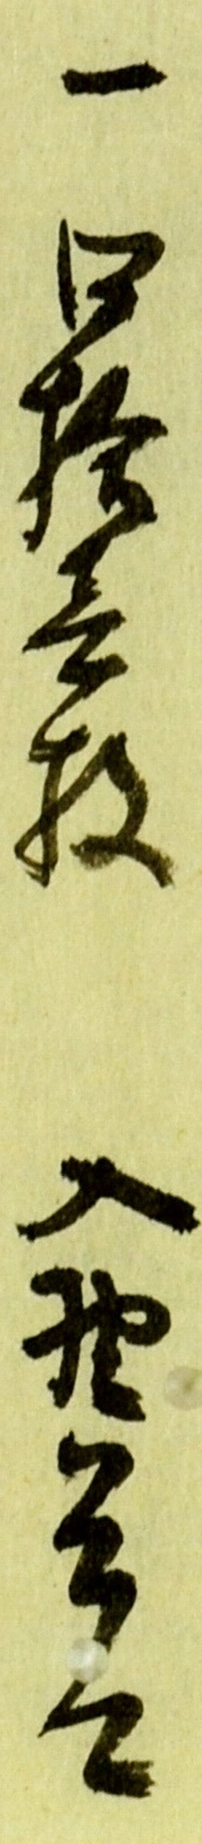一四拾壱枚入野谷郷
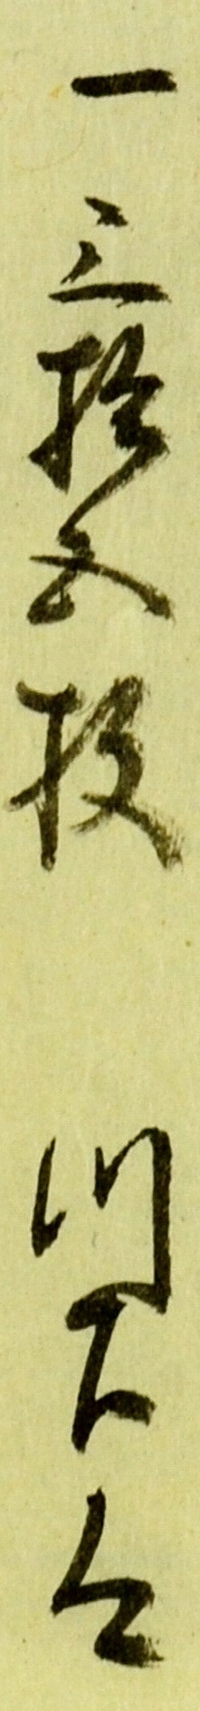一三拾五枚川下郷
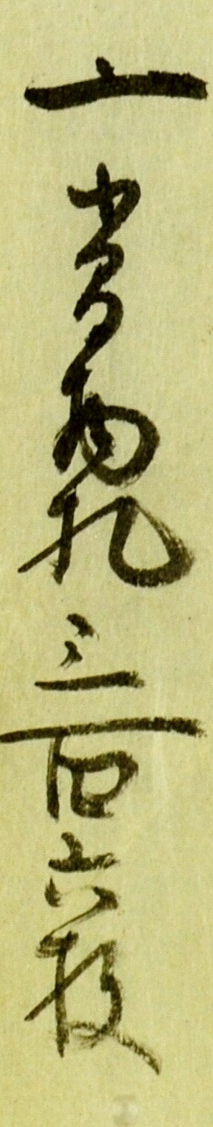〆小間物札三百六枚
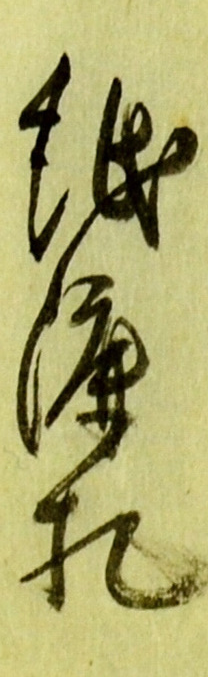紙漉札

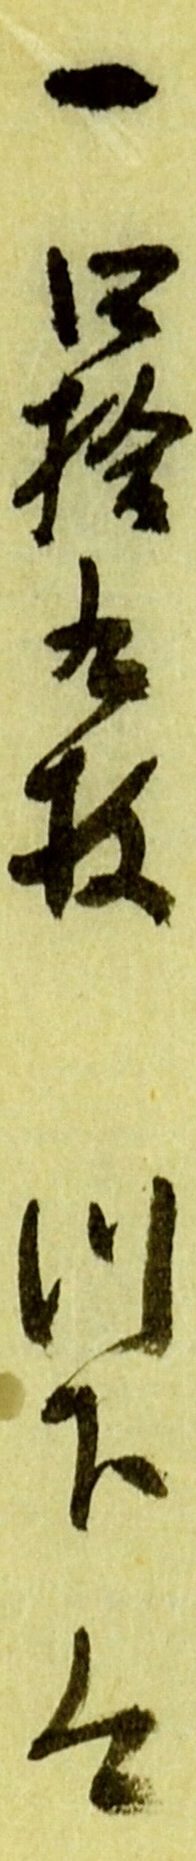一四拾九枚川下郷
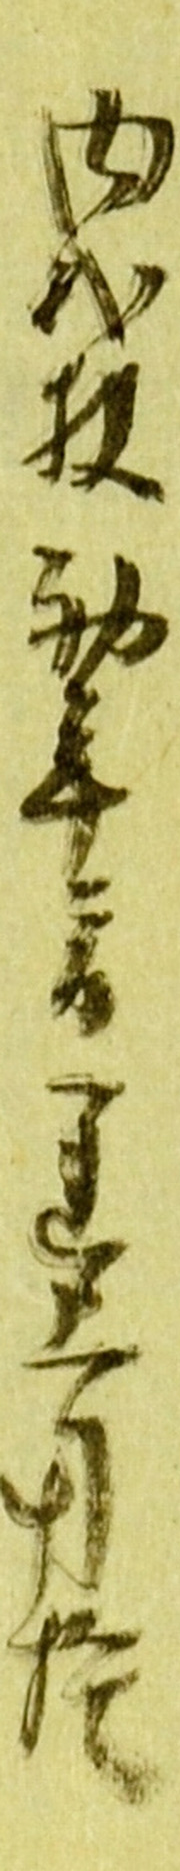内弐枚初年ニ而運上用捨
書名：午年諸郷并町方鑑札渡覚
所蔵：伊那市立高遠町図書館・合同会社AMANE
